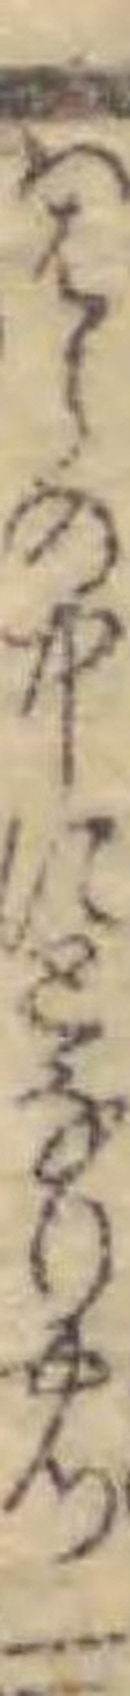ははらの中にとなりやつ
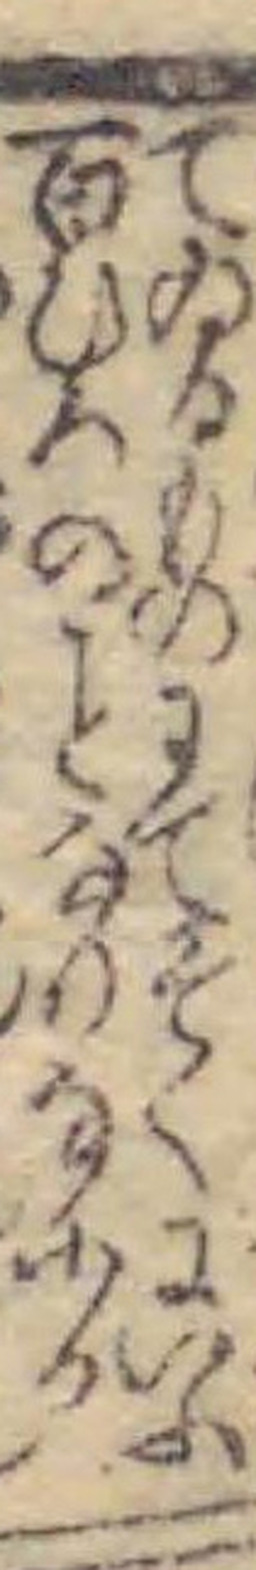百ひろのことなりなにか
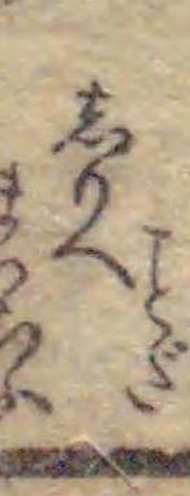しりへ
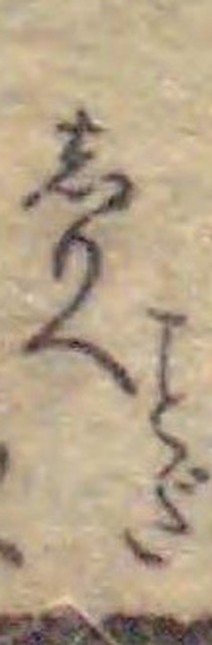しりへ
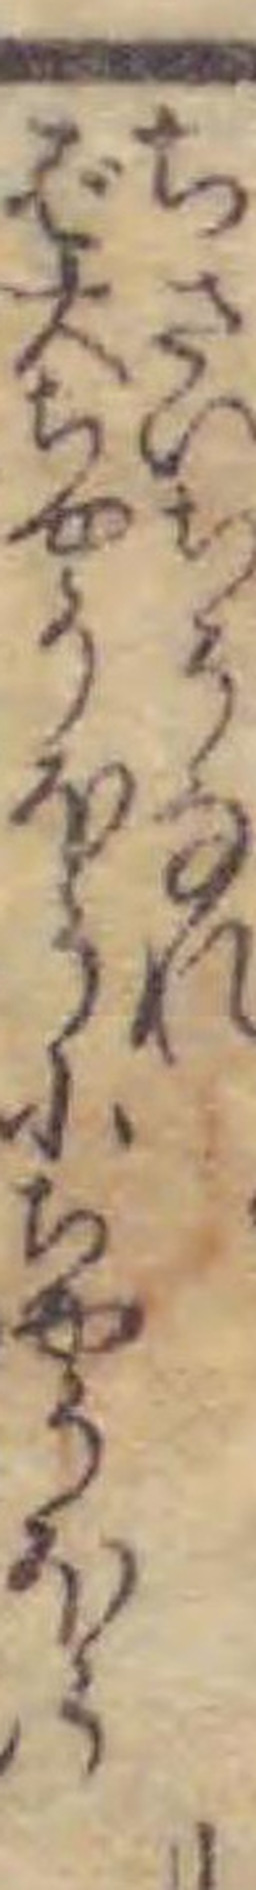ば大ちやうほう小ちやうほう
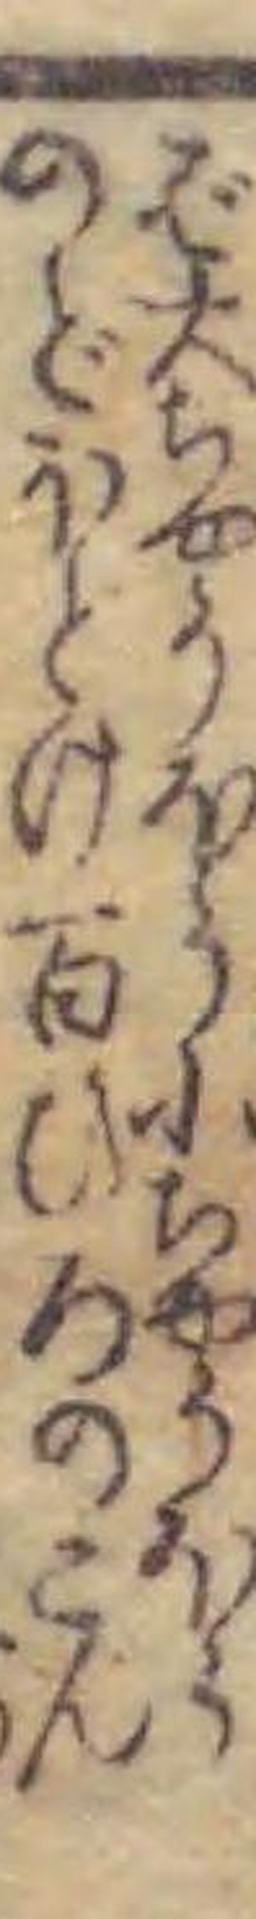のどほとけ百ひろのこん
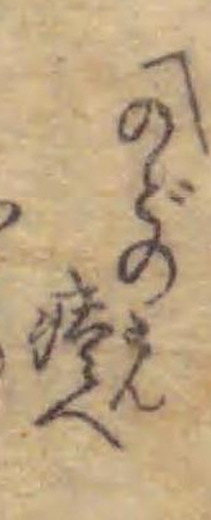〽のどの

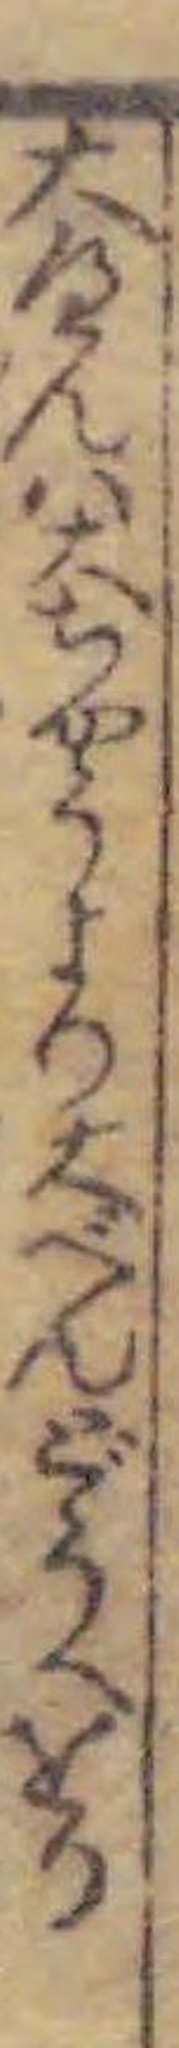大へんは大ちやうより大べんどうへをり
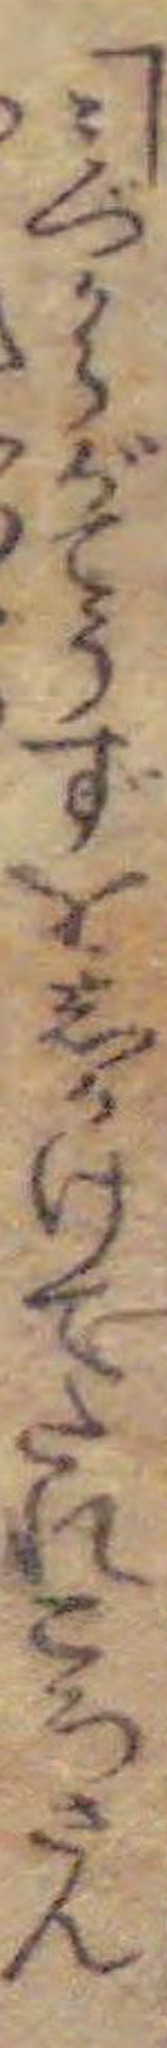〽みづからがてうずをしかけてたれころさん
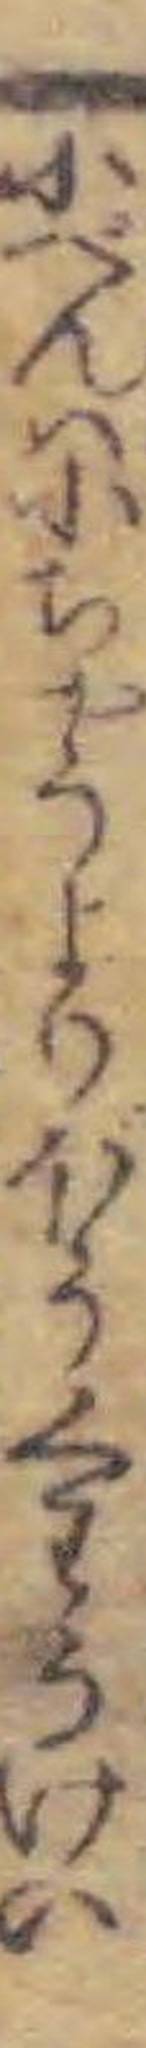小べんは小ちやうよりぼうくわうけい
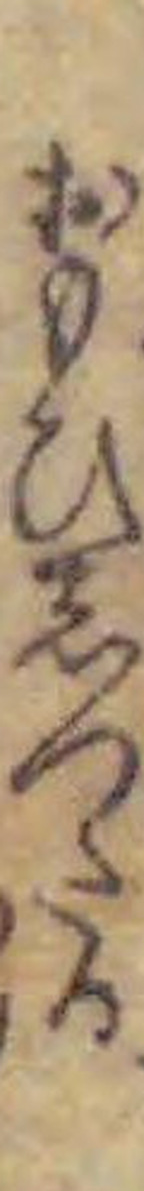おもひしつたる
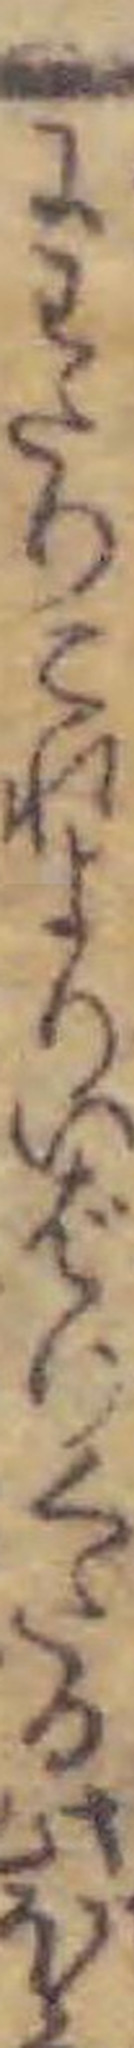にわたりこれよりいばりくたる此ほう
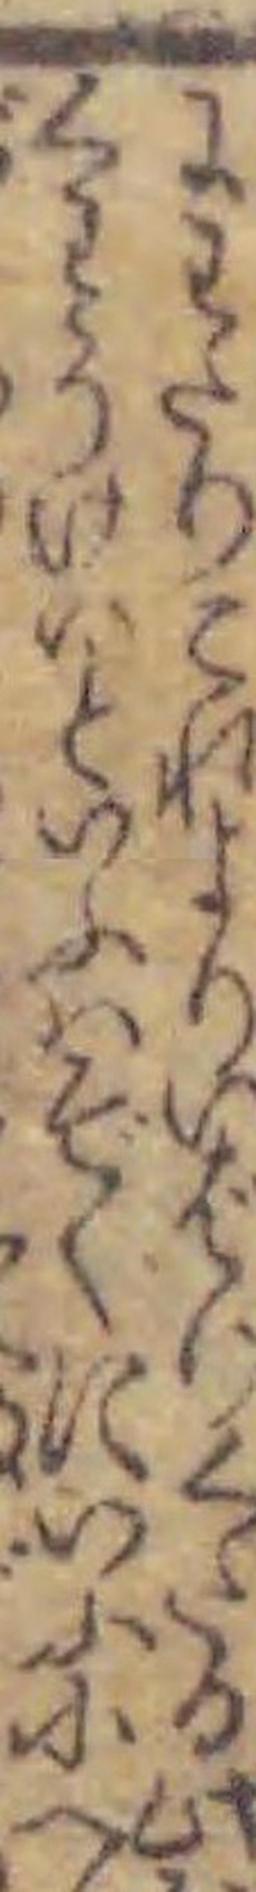くわうけいといふはぞくにいふ小へん
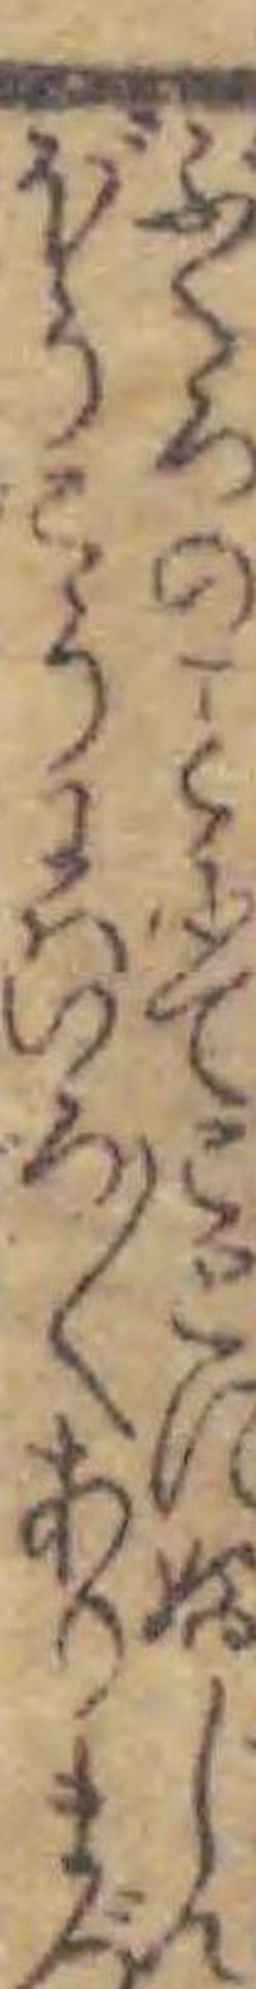ぼうこうにはいろ〳〵ありまづ
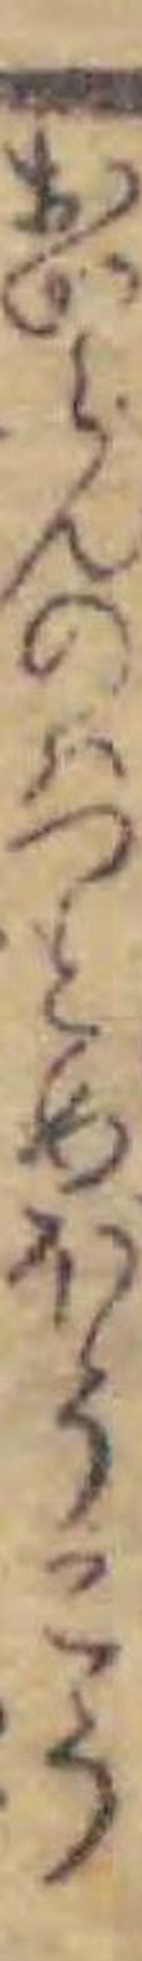おいらんのはつとめぼうこう
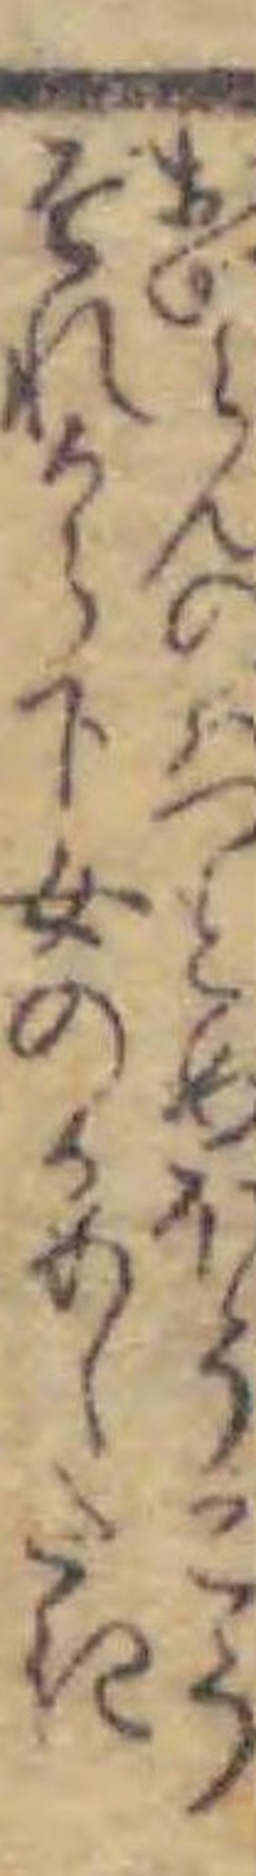それから下女のかめしたき
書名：十四傾城腹之内 : 3巻
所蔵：国立国会図書館 National Diet Library, JAPAN
